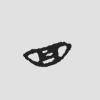四
